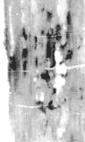東
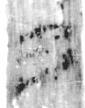井
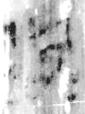九
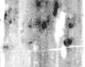月
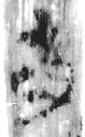十月
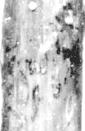獻
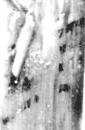馬
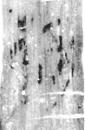房
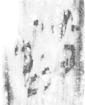冬（冬）
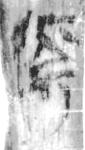○（夕）
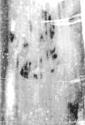心
